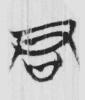君
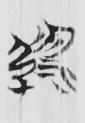溺
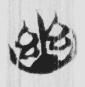幽
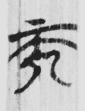而
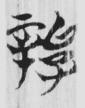{辛㠯子}
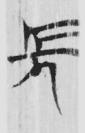長
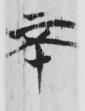不
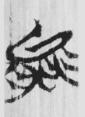能
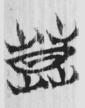莫
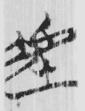𫊟
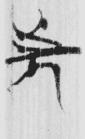先
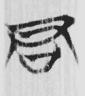君
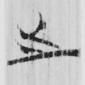之
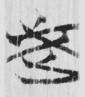武
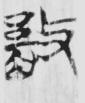{育攴}
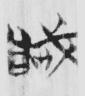戕
